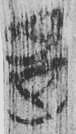是
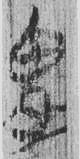{胃刀}（謂）
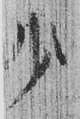少（小）
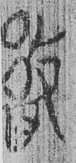○（徹）
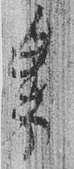○（奚）
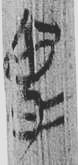{胃刀}（謂）
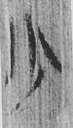少（小）
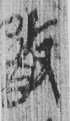○（徹）
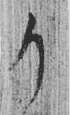人
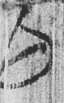白
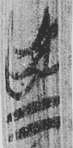爲
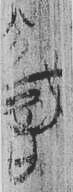○（察）
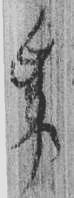○（奚）
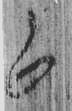㠯（以）
